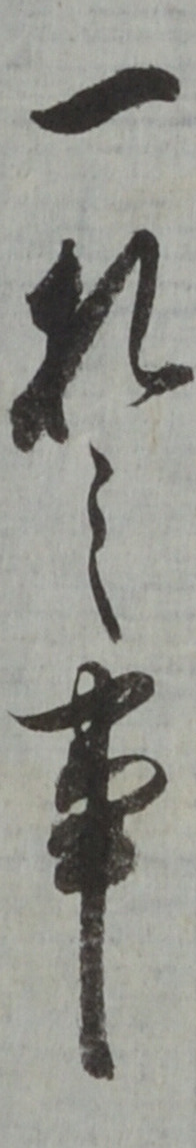一札之事
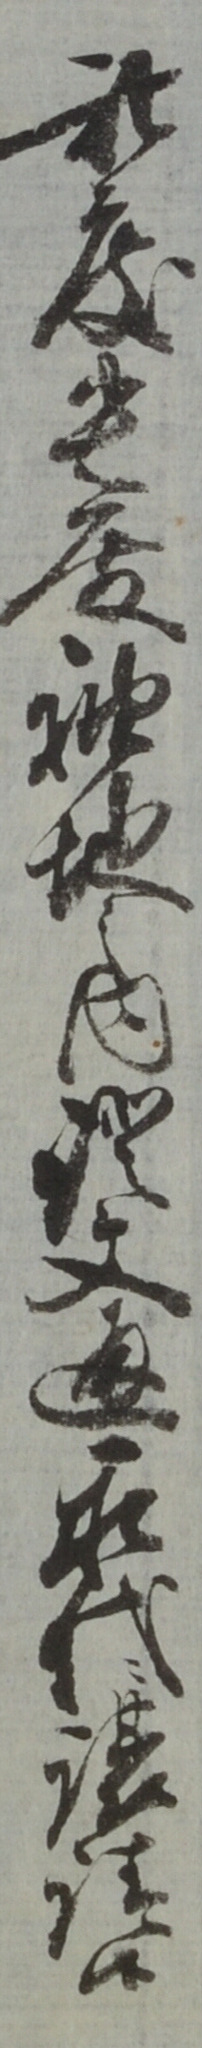此度貴殿神地之内証文通永代ニ譲請候
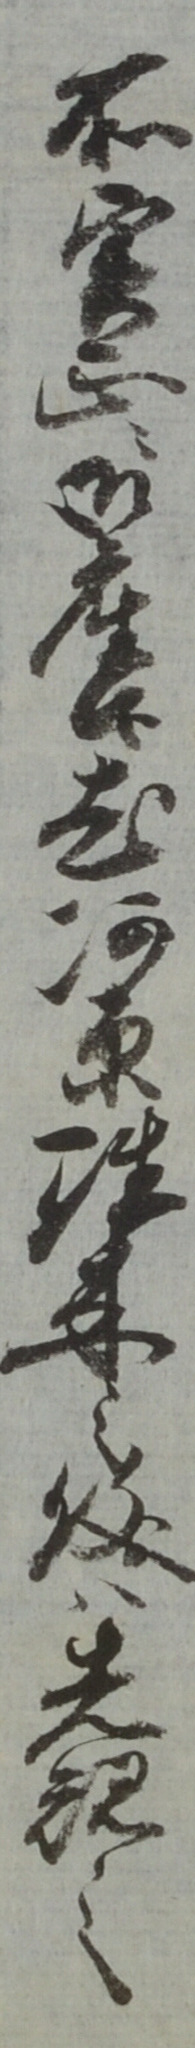所実正ニ御座候尤河東往来之儀ハ先規之
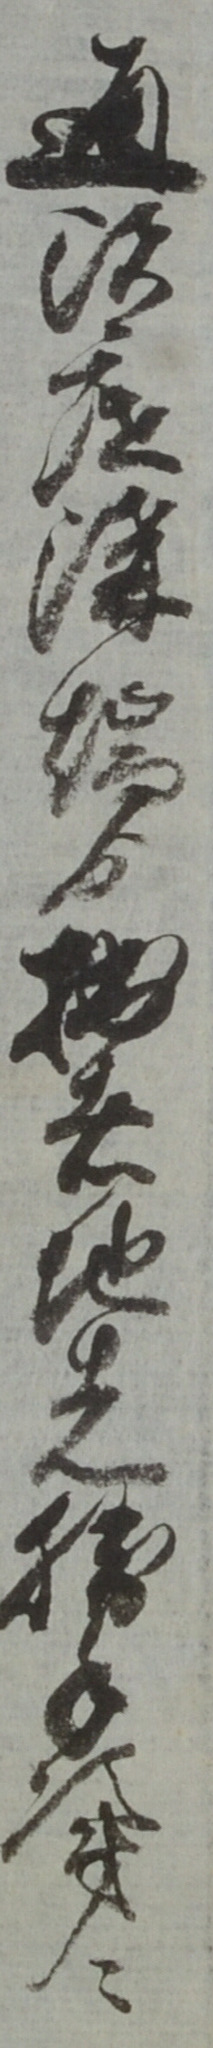通沢底溝端ゟ拙者地者勝手次第ニ
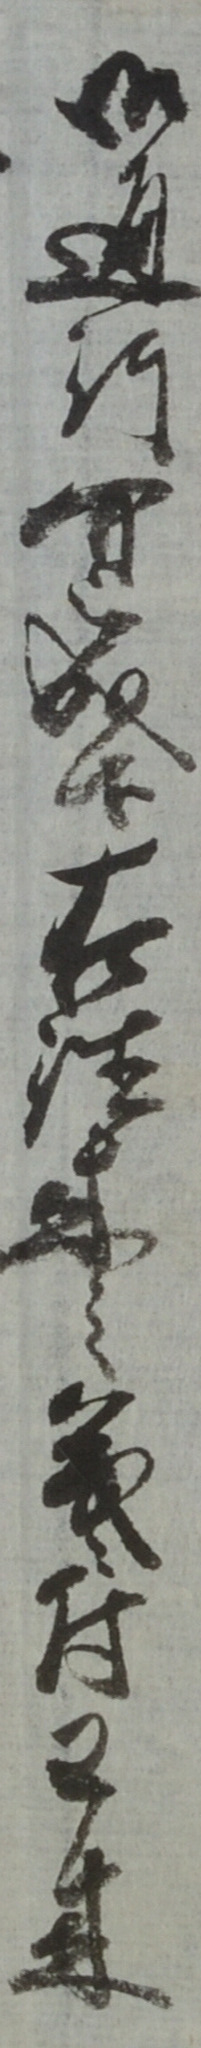御通行可被成候右往来之義ニ付已来
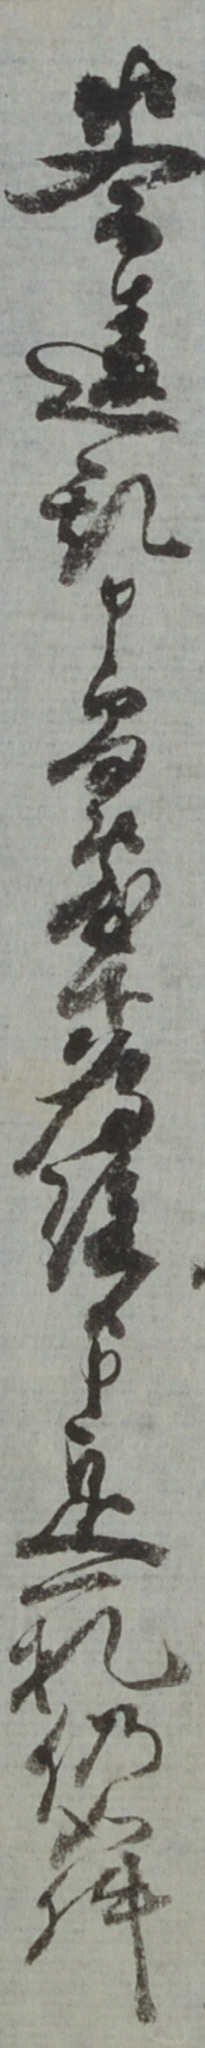決而違乱申間敷候為後日申定一札仍如件
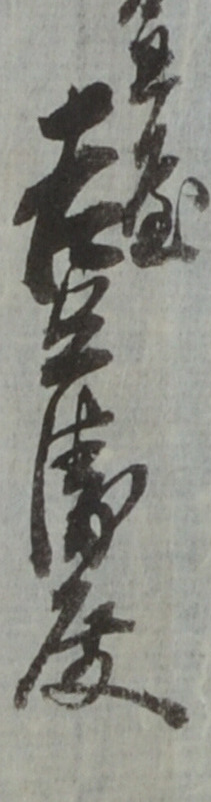吉兵衛殿
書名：永代譲渡申神地証文之事
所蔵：伊那市立高遠町図書館・合同会社AMANE
